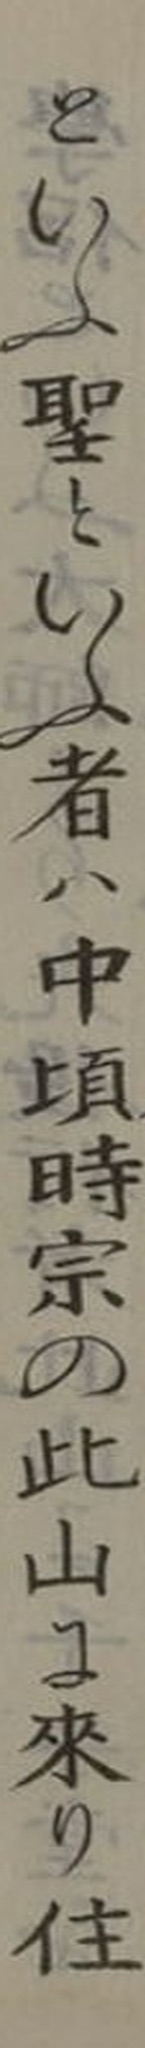といふ聖といふ者は中頃時宗の此山に來り住
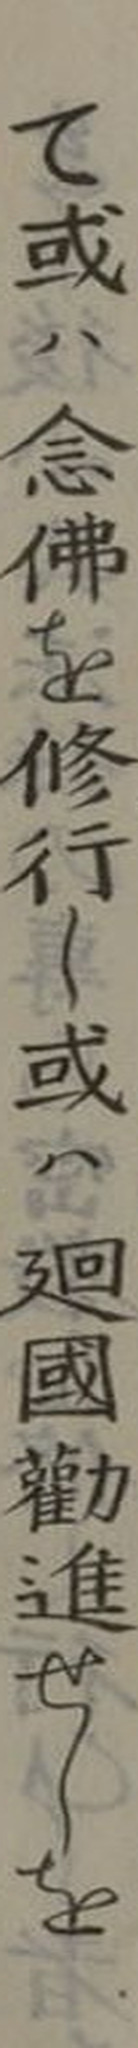て或は念佛を修行し或は廻國勸進せしを
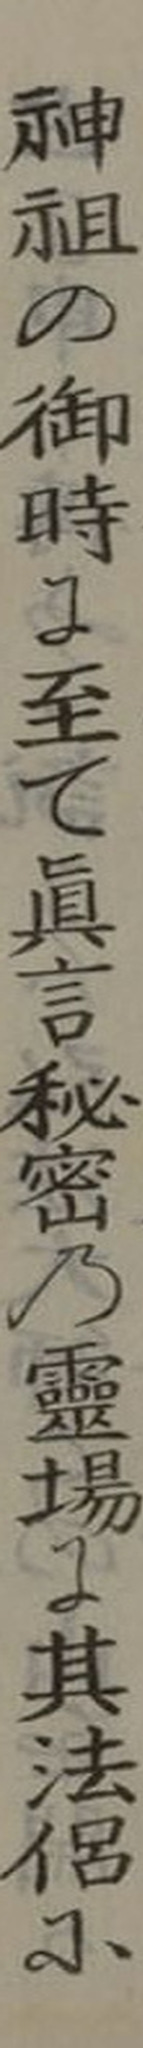神祖の御時に至て眞言秘密の靈場に其法侶に
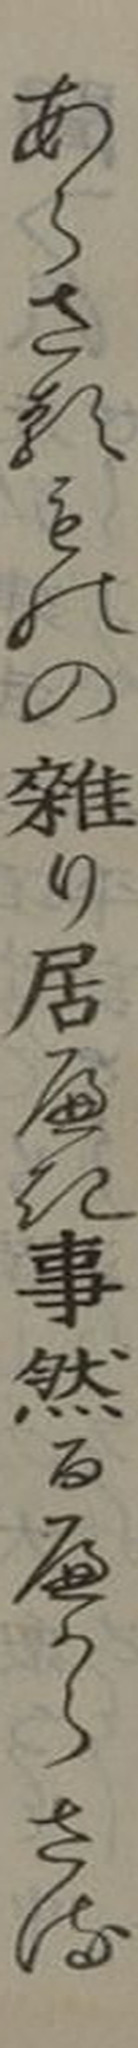あらさるものの雜り居へき事然るへからさる
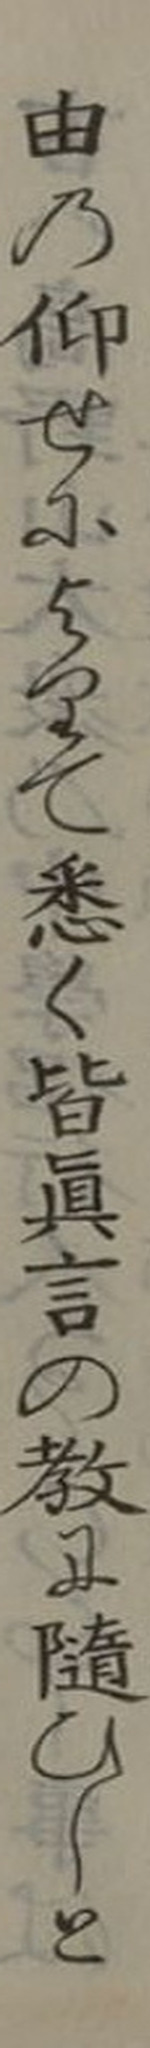由の仰せによりて悉く皆眞言の教に随ひしと
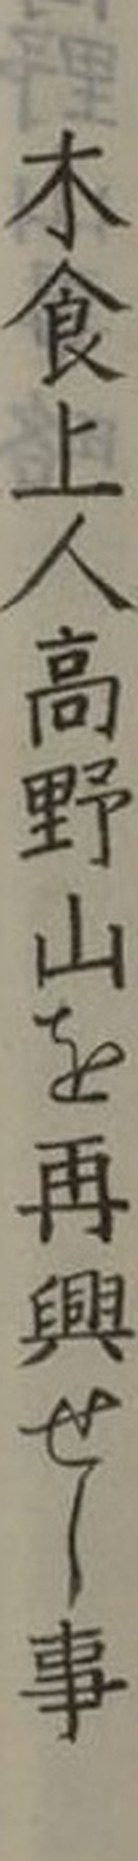木食上人高野山を再興せし事
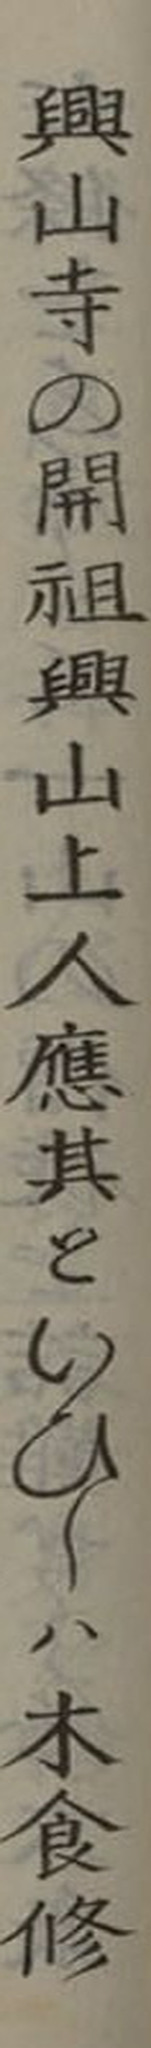興山寺の開祖興山上人應其といひしは木食修
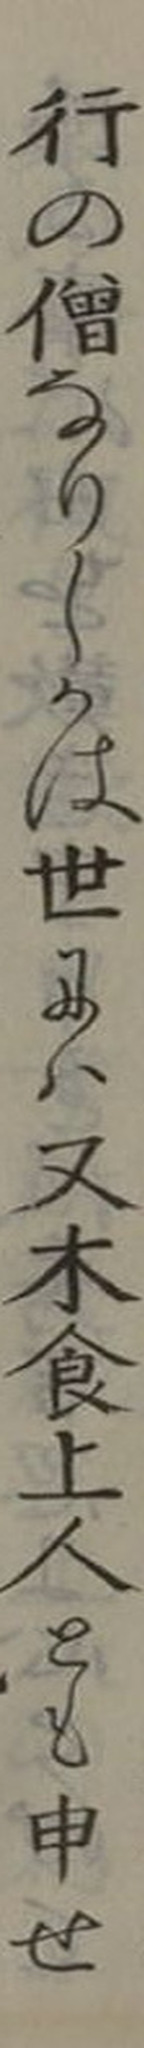行の僧なりしかは世には又木食上人とも申せ
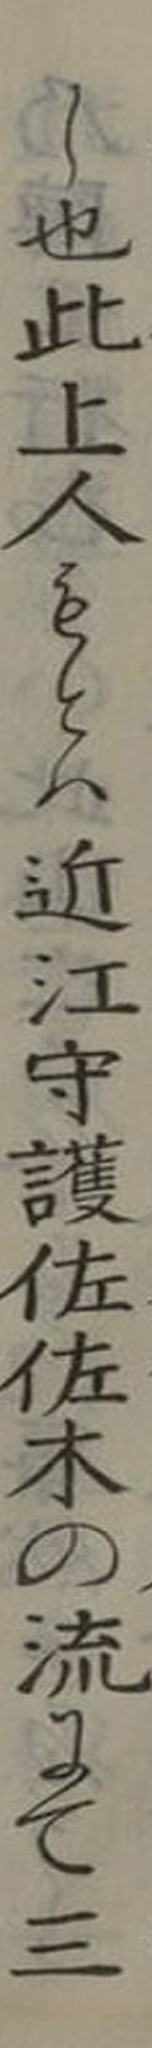し也此上人もとは近江守護佐佐木の流にて三
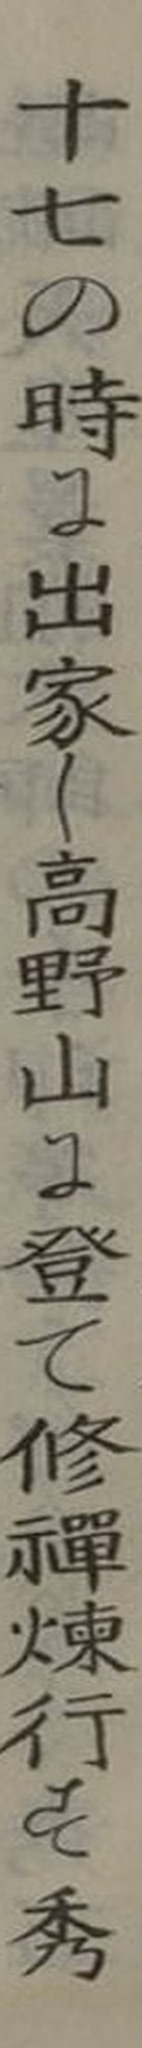十七の時に出家し高野山に登て修禪煉行す秀
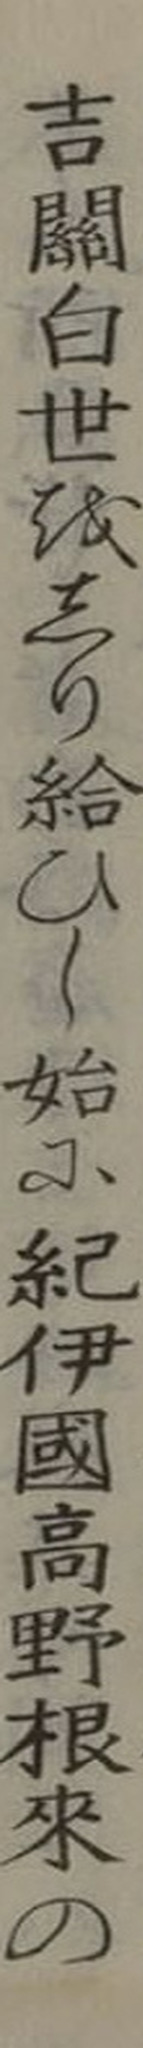吉關白世をしり給ひし始に紀伊國高野根來の
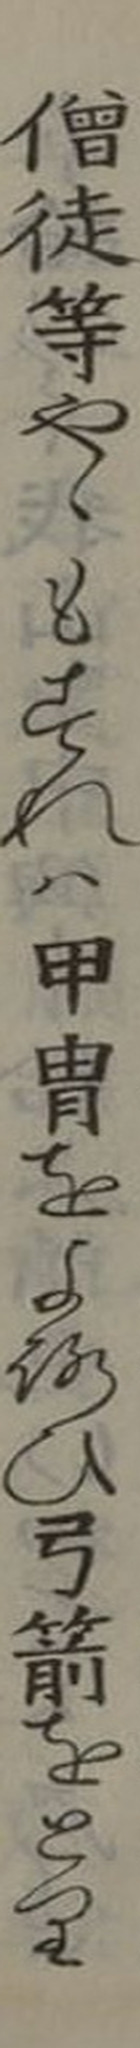僧徒等やゝもすれは甲冑をよろひ弓箭をとり
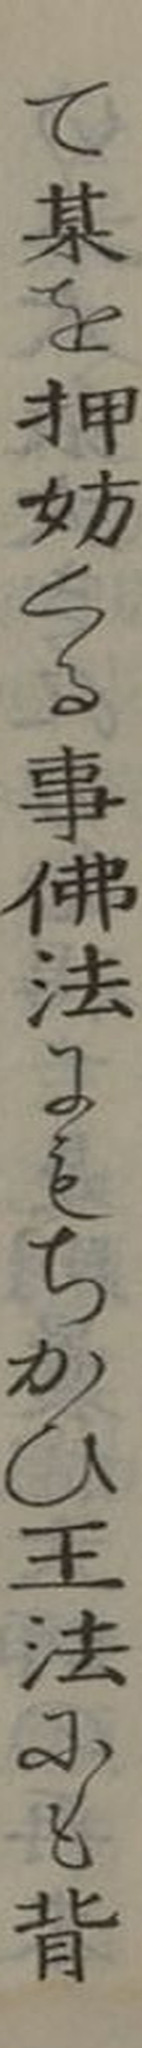て某を押妨たる事佛法にもちかひ王法にも背
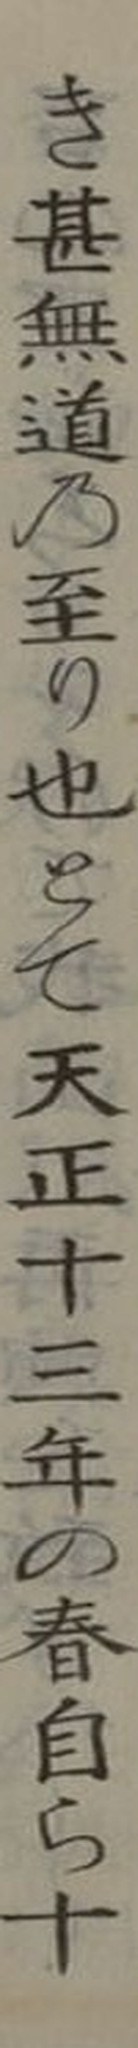き甚無道の至り也とて天正十三年の春自ら十
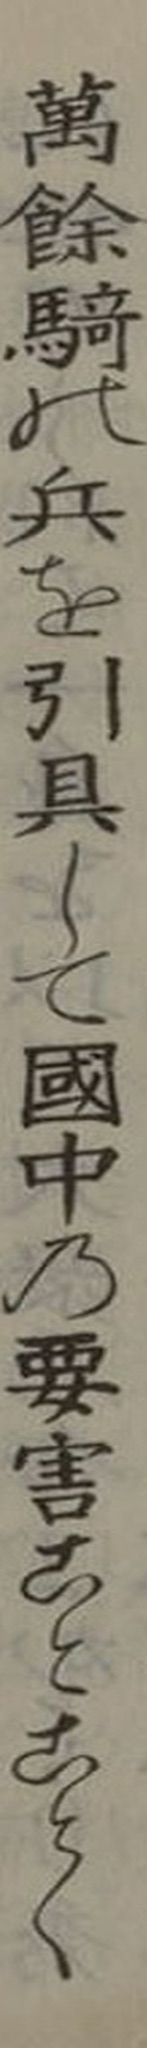萬餘騎の兵引具して國中の要害ことことく
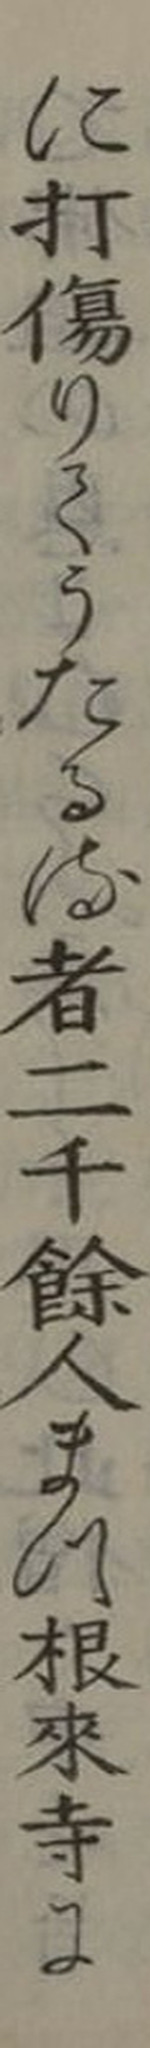に打傷りてうたるる者二千餘人まつ根來寺に
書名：骨董録
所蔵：University of the Ryukyus Library
